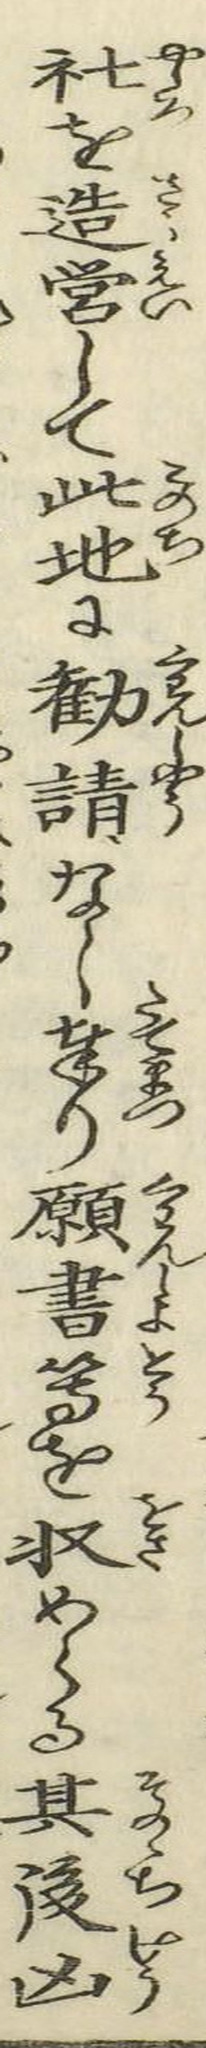社を造営して此地に勧請なし奉り願書等を収めらる其後凶
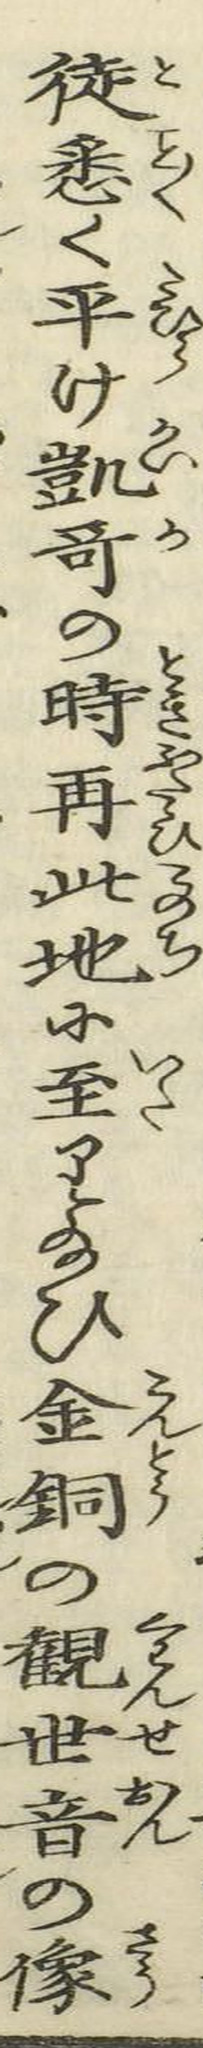徒悉く平け凱哥の時再此地に至り給ひ金銅の観世音の像
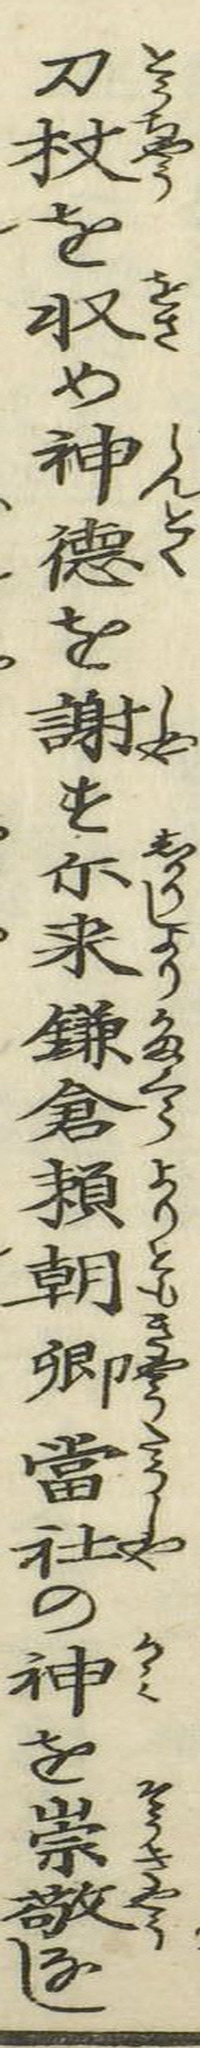刀杖を収め神徳を謝す尓来鎌倉頼朝卿当社の神を崇敬なし
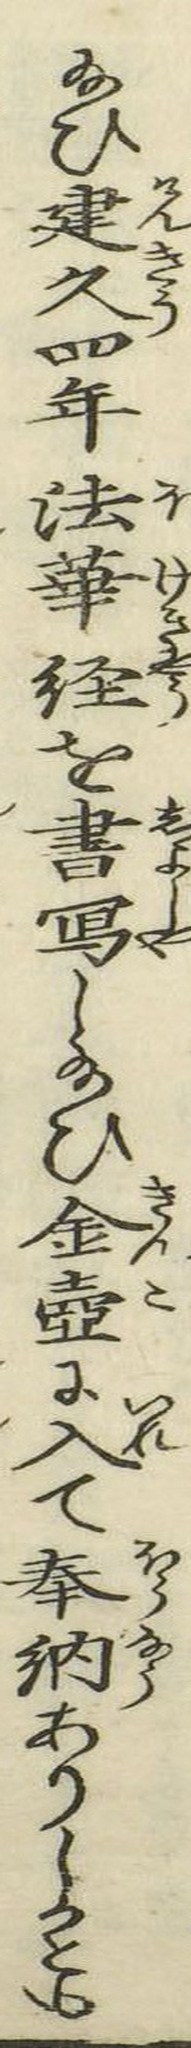給ひ建久四年法華経を書写し給ひ金壺に入て奉納ありしかとも
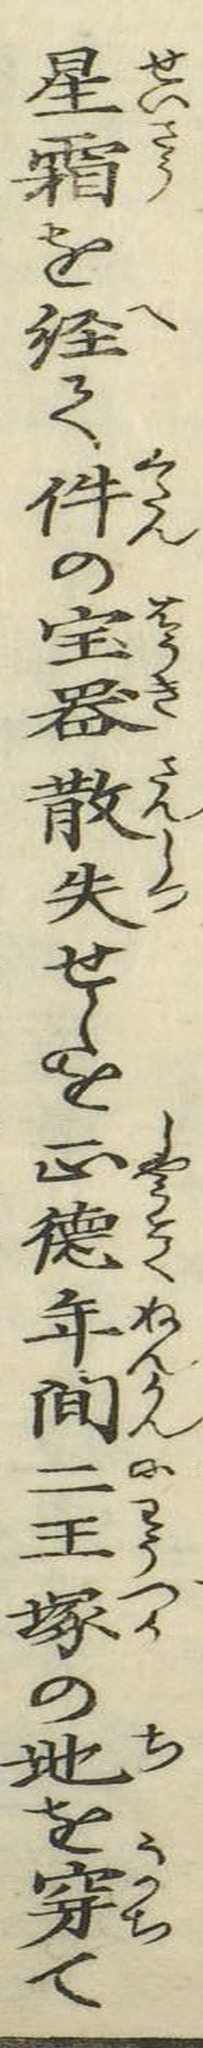星霜を経て件の宝器散失せしを正徳年間二王塚の地を穿て
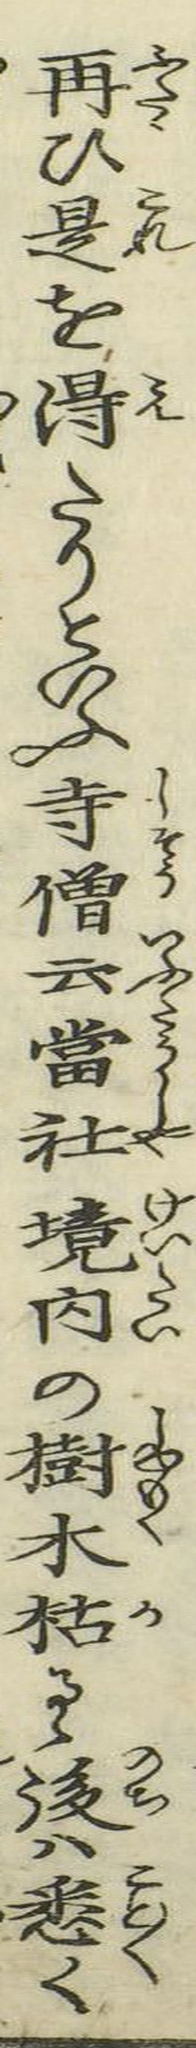再ひ是を得たりといふ寺僧云当社境内の樹木枯るゝ後は悉く
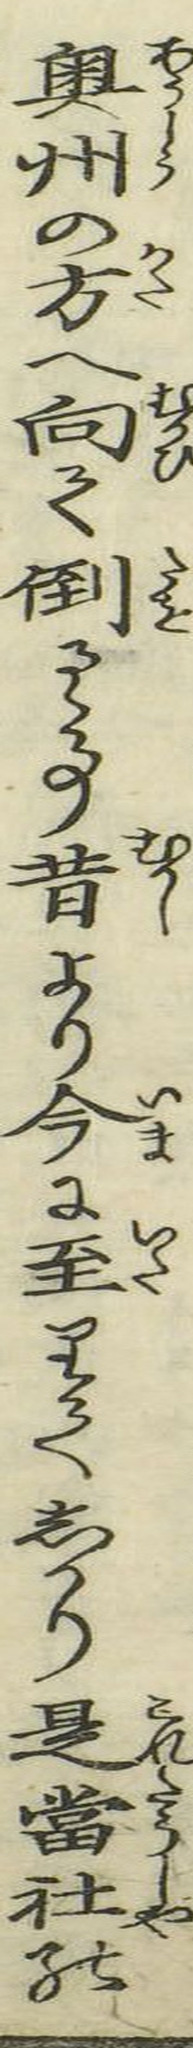奥州の方へ向て倒るゝ事昔より今に至りてしかり是当社の
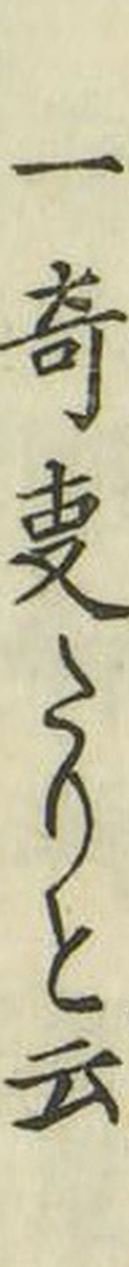一奇叓たりと云

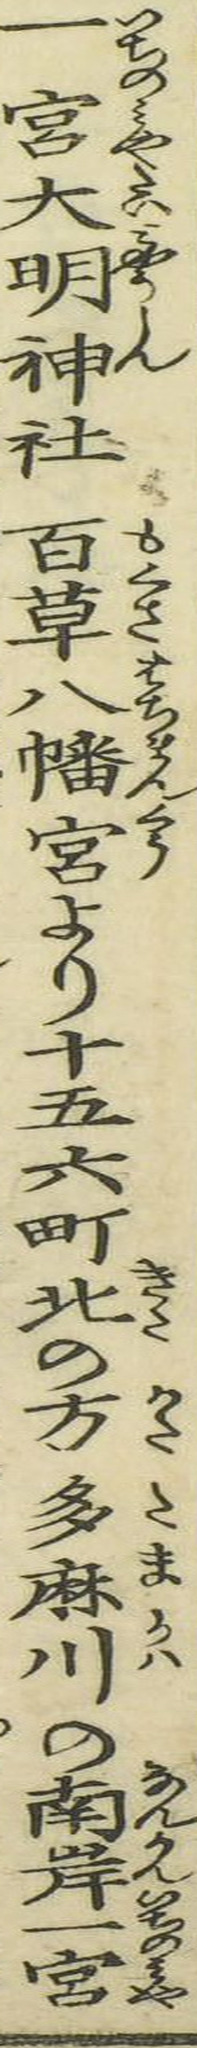一宮大明神社百草八幡宮より十五六町北の方多麻川の南岸一宮
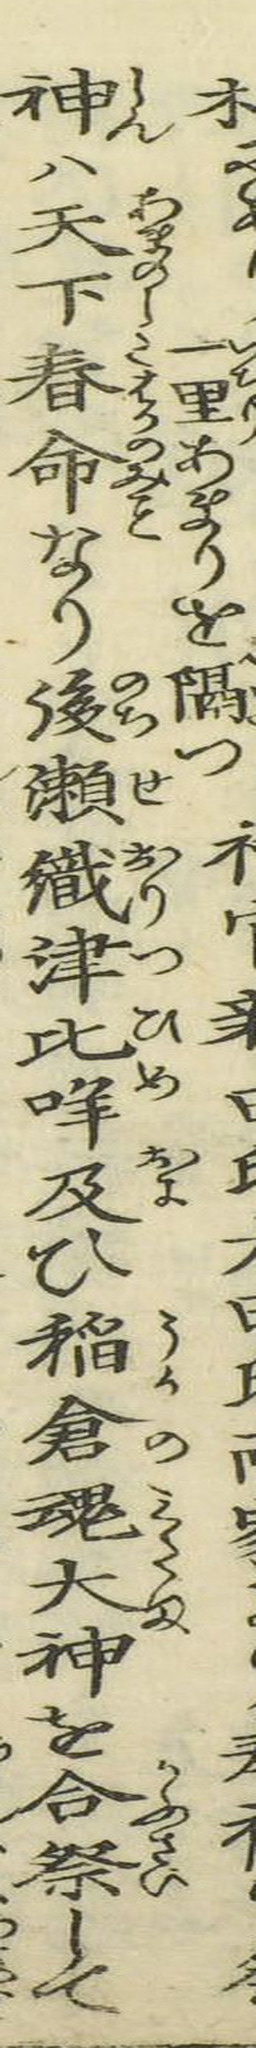神は天下春命なり後瀬織津比咩及ひ稲倉魂大神を合祭して
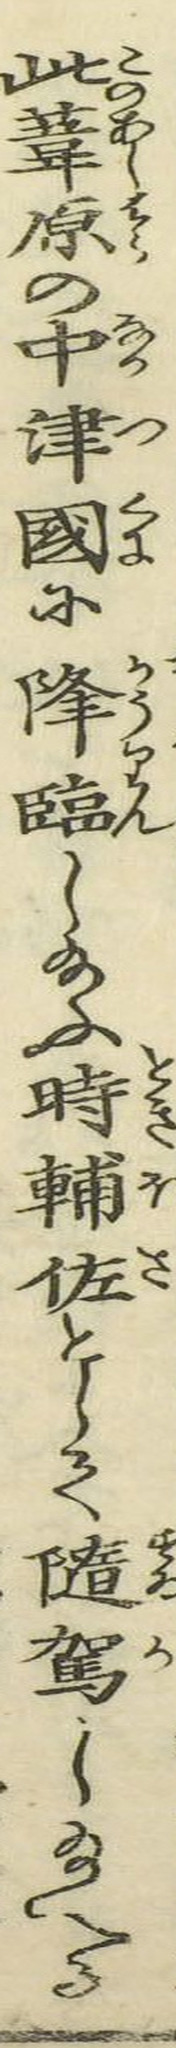此葦原の中津国に降臨し給ふ時輔佐として随駕し給へる
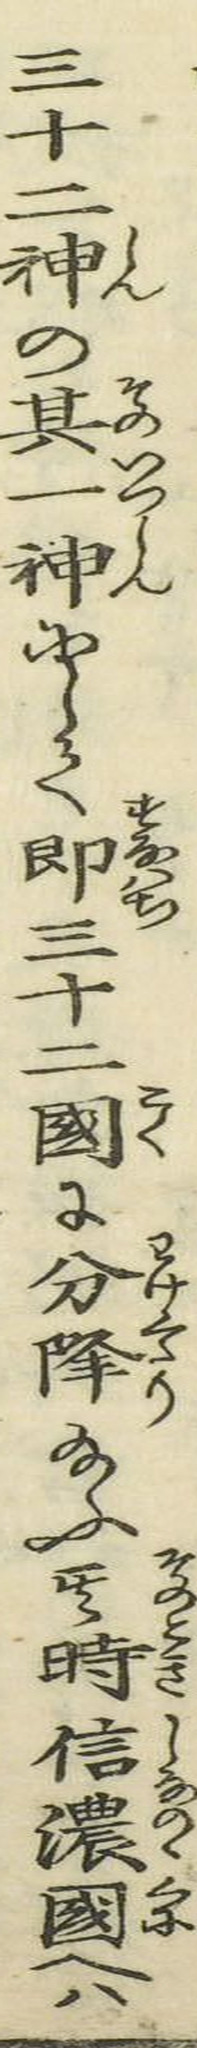三十二神の其一神にして即三十二国に分降給ふ其時信濃国へは
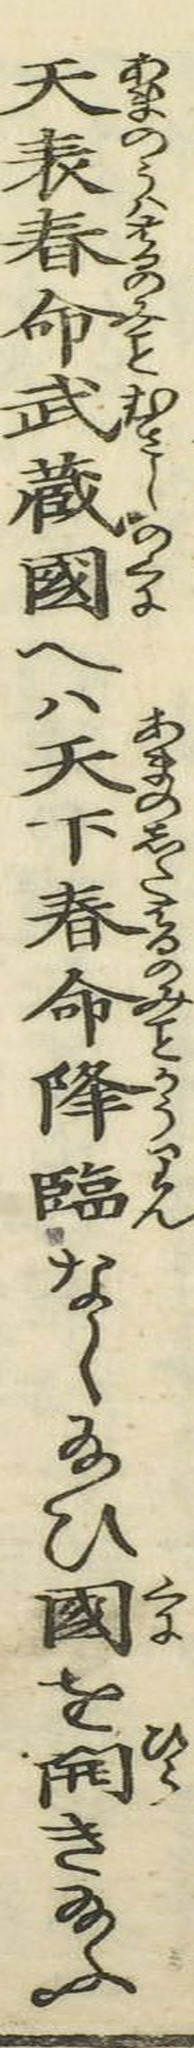天表春命武蔵国へは天下春命降臨なし給ひ国を開き給ふ
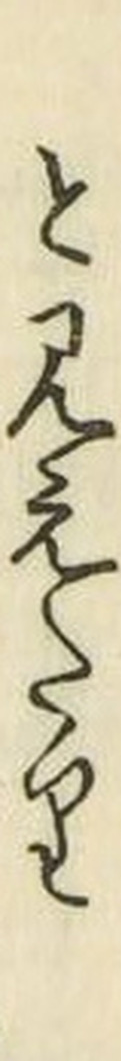と見えたり
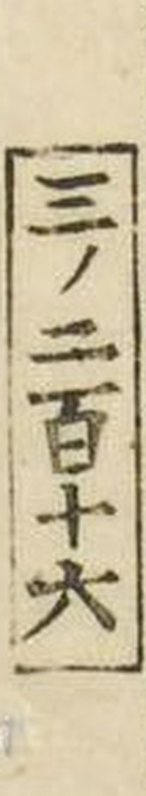三ノ二百十六
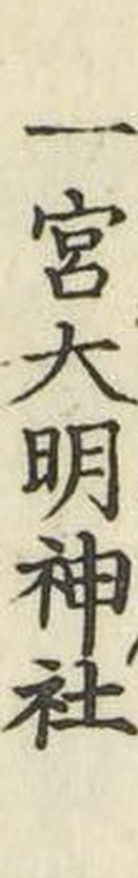一宮大明神社
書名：江戸名所図会 20巻 巻之10
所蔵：東京学芸大学教育コンテンツアーカイブ
